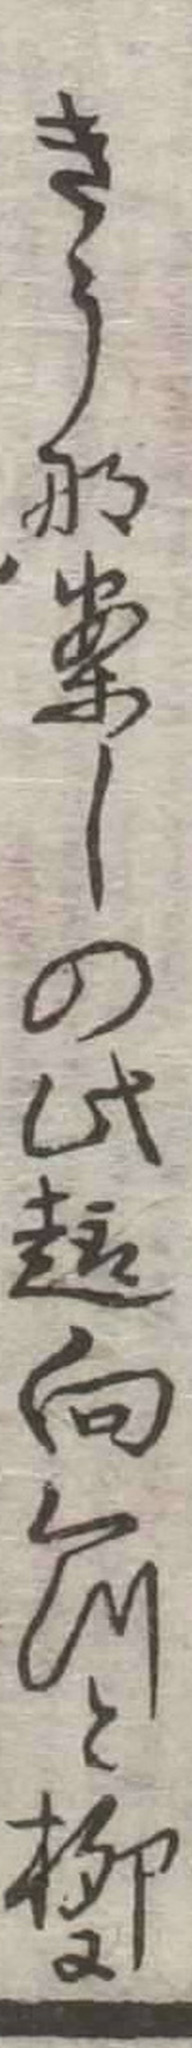きうな案しの此趣向くつと柳に
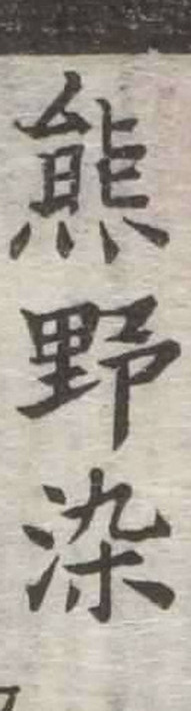熊野染
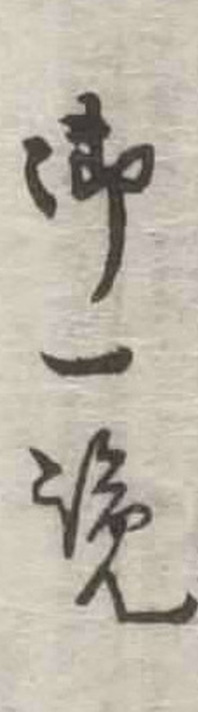御一覧
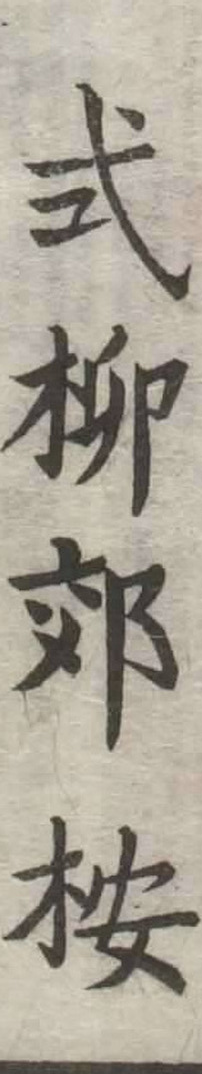式柳郊桉
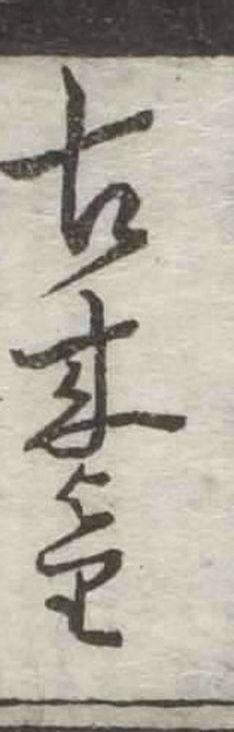古来より
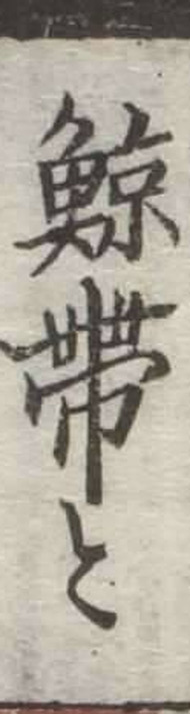鯨帯と
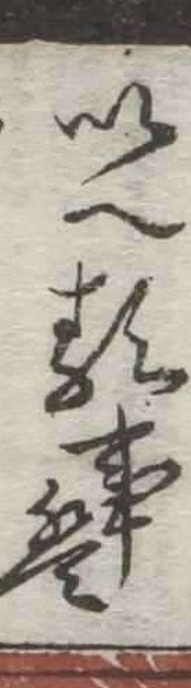いへる事は
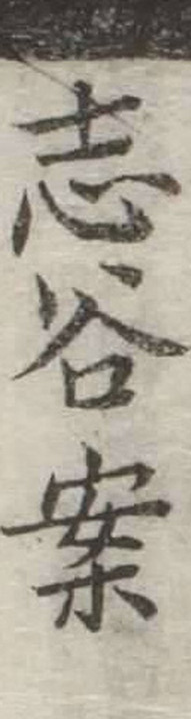志谷案

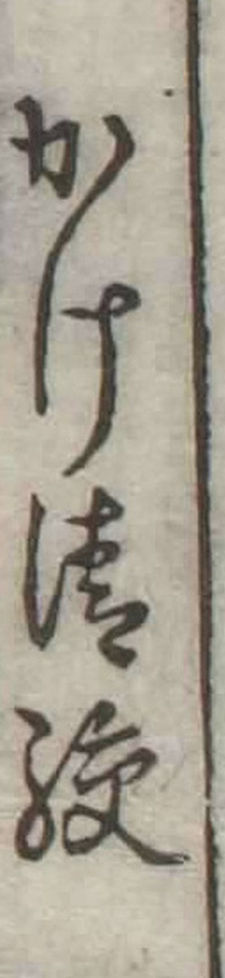かけ清絞
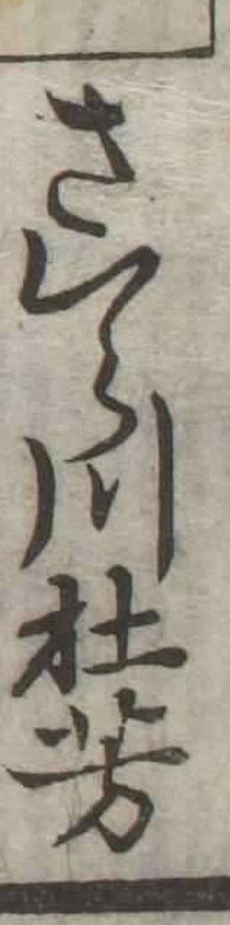さくら川杜芳
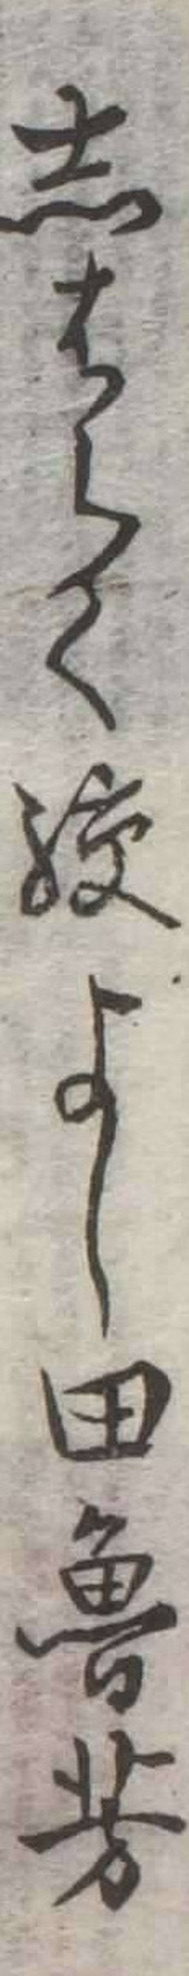しはらく絞よし田魯芳
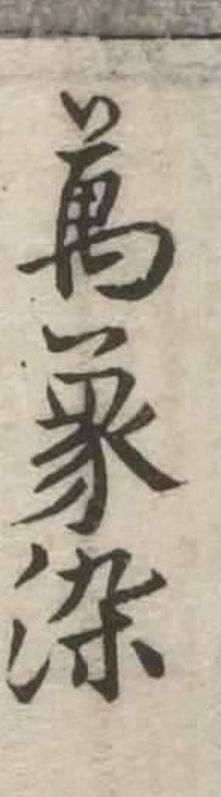萬象染
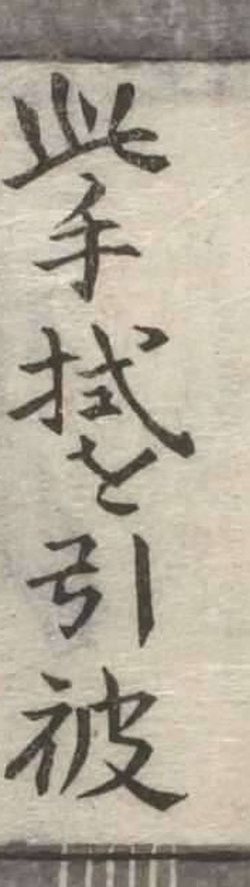此手拭を引被
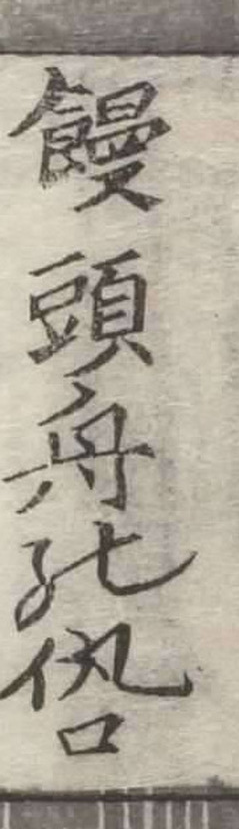饅頭舟の仇口
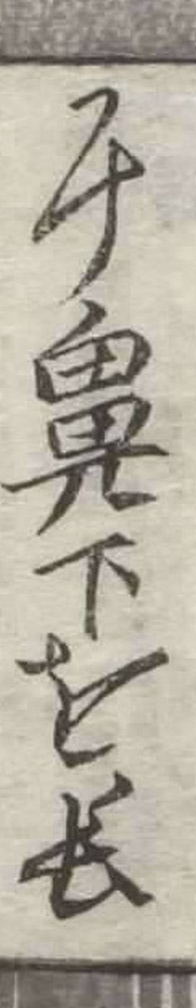に鼻下を長
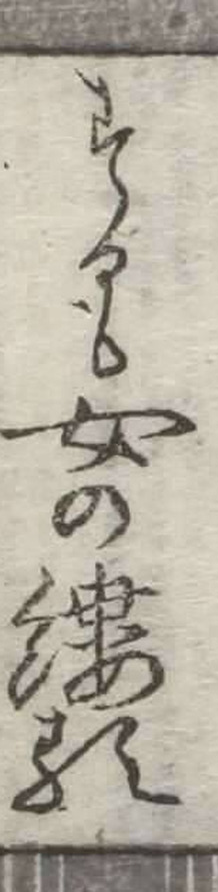するも女の縷る
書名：たなくひあわせ
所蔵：国文学研究資料館
